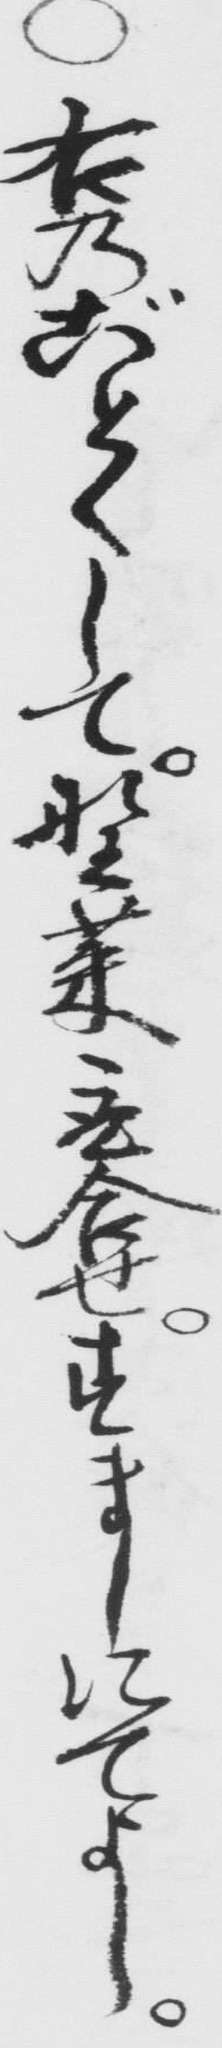○右のごとくして。野菜取合せ。すましにてよし。
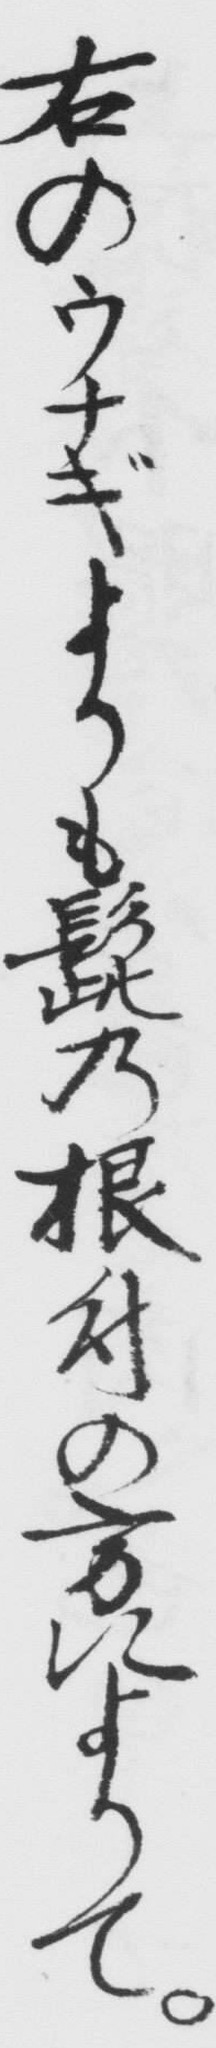ウナ右のウナギよりも髭の根付の方によりて。
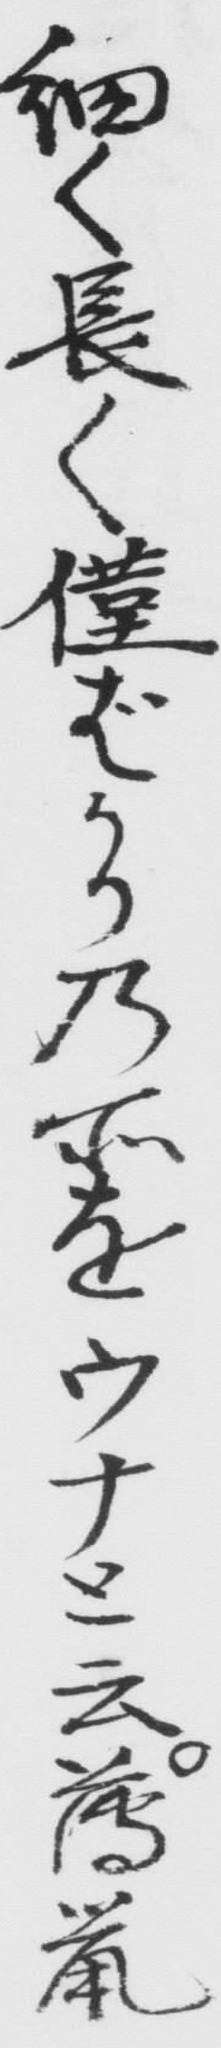細く長く僅ばかりの所をウナと云。薄鼠
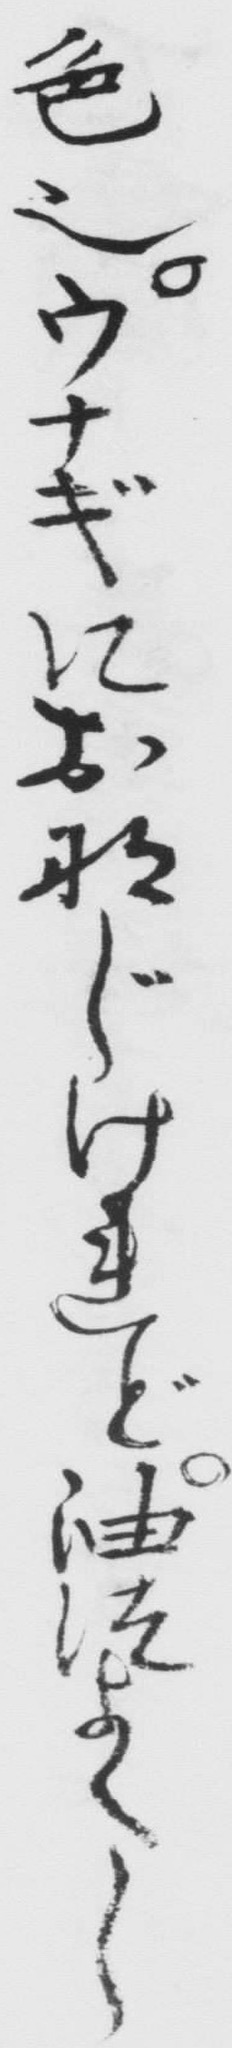色也。ウナギにおなじけれど。油つよくし

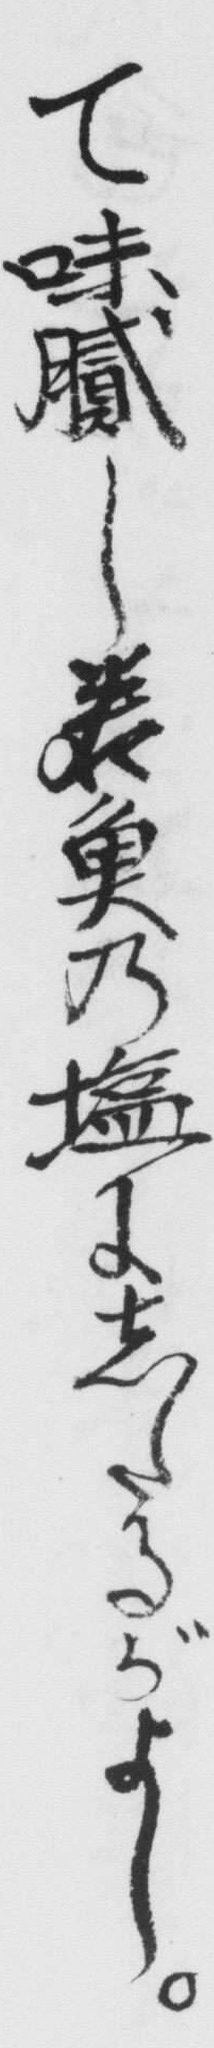て味膩し若魚の塩にしたるがよし。
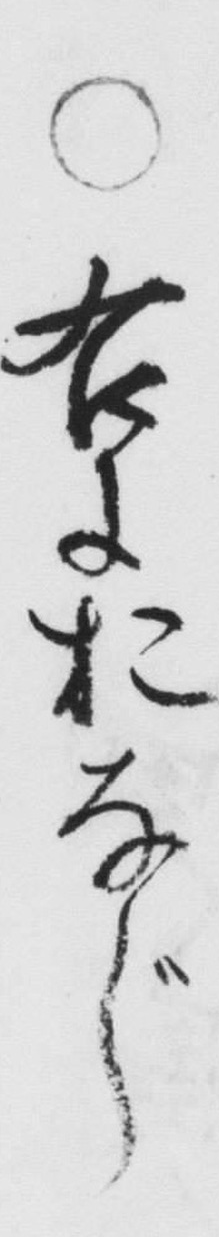○右におなじ
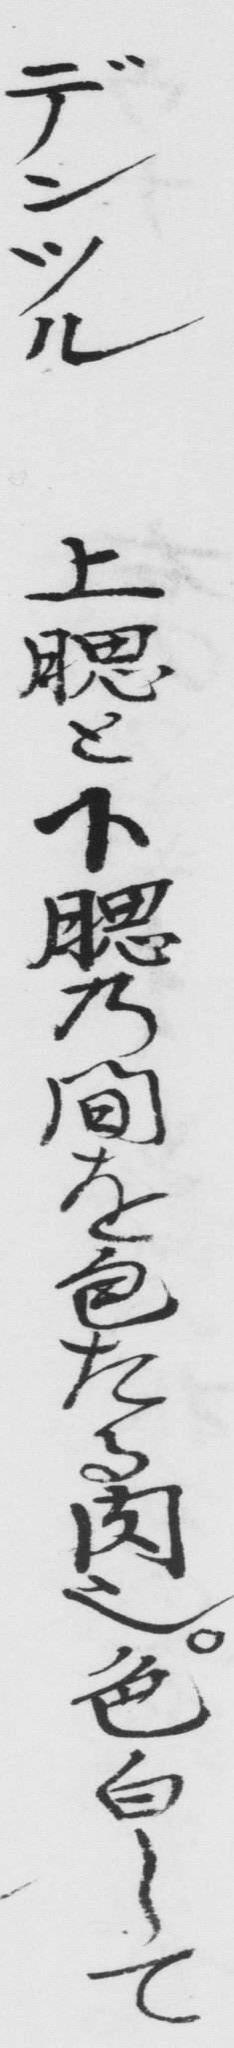デンツル上腮と下腮の間を包たる肉也。色白して
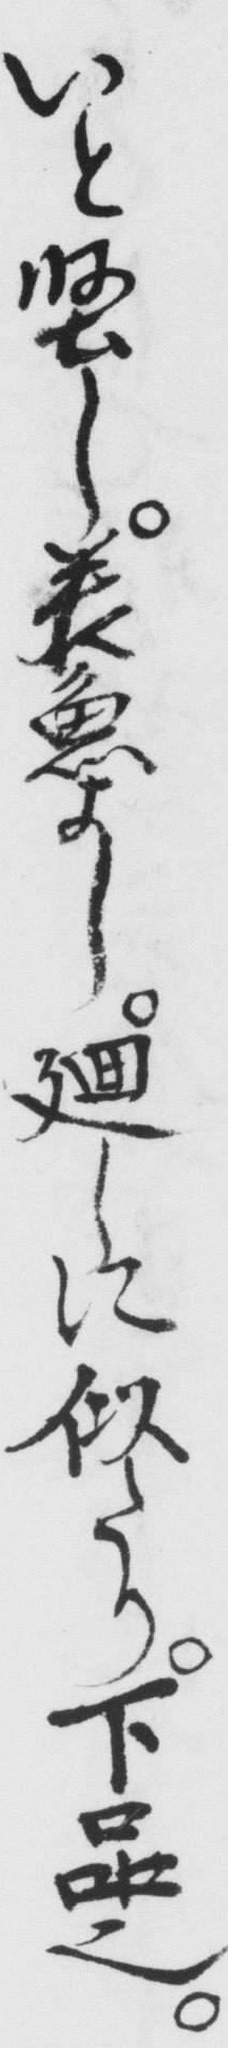いと堅し。若魚よし。廻しに似たり。下品也。
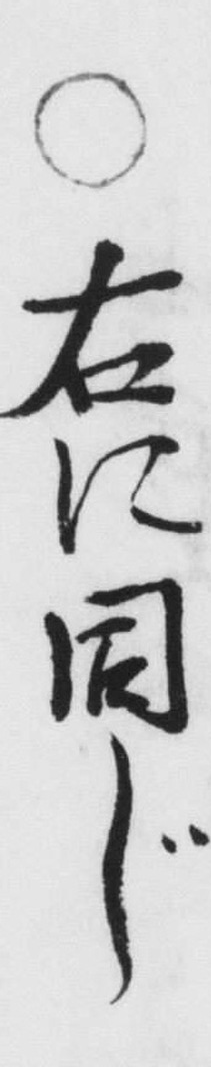○右に同じ
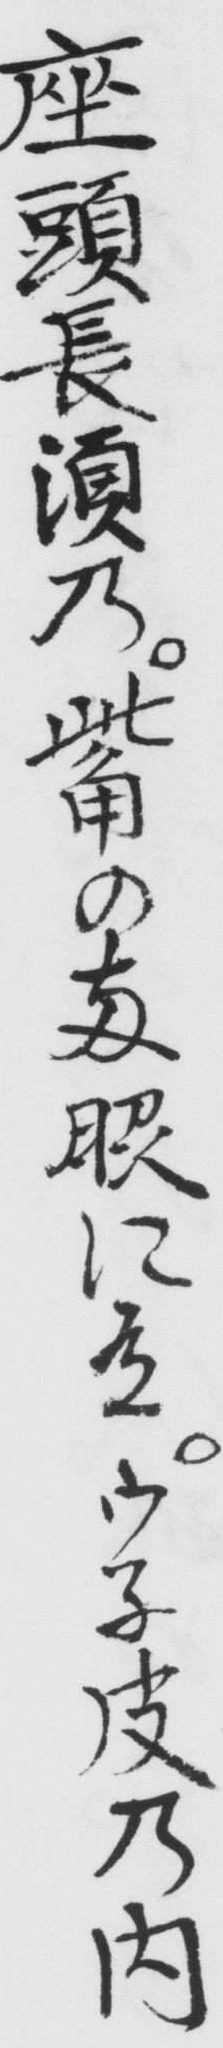腮骨座頭長須の。觜の両脇に有。ウネ皮の内
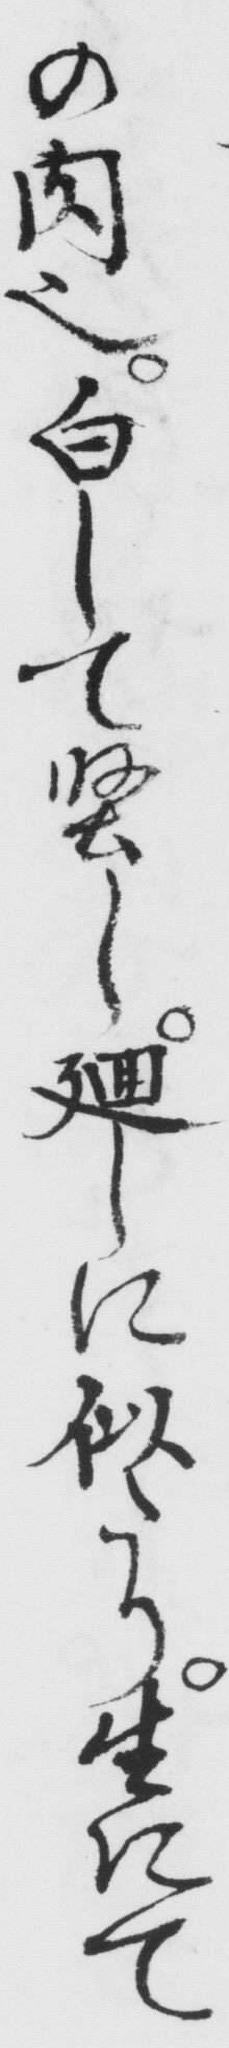の肉也。白して堅し。廻しに似たり。生にて
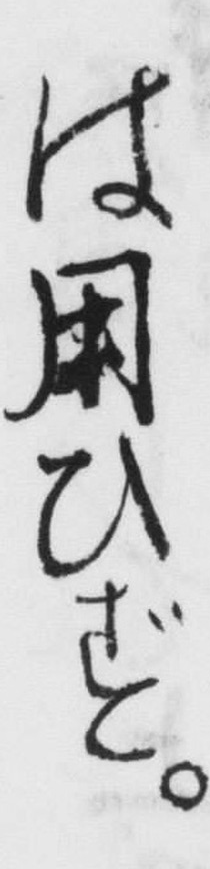は用いず。
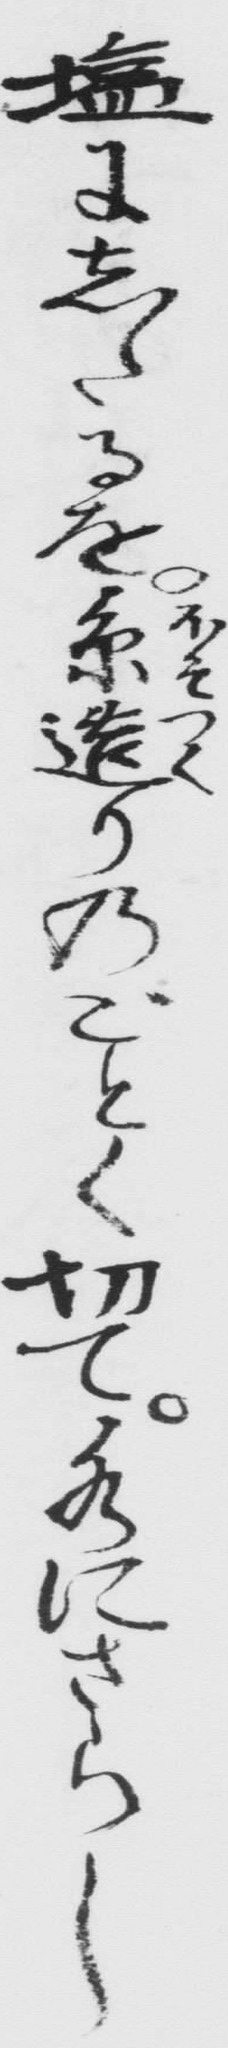○塩にしたるを糸造りのごとく切て。水にさらし
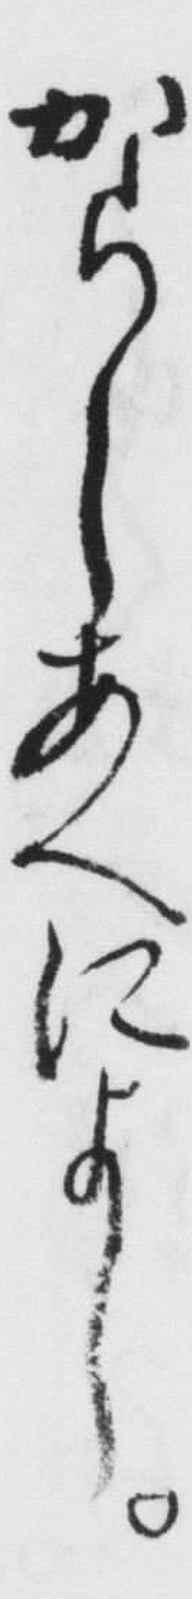からしあへによし。
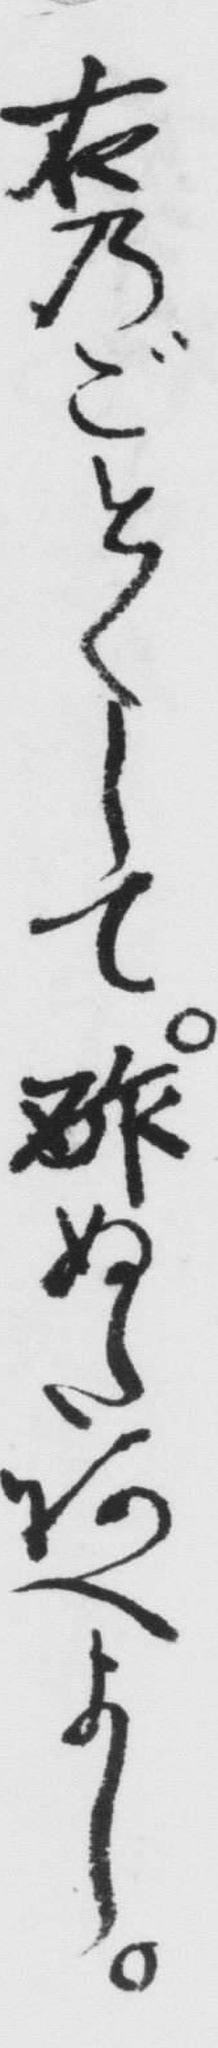○右のごとくして。酢ぬたあへよし。
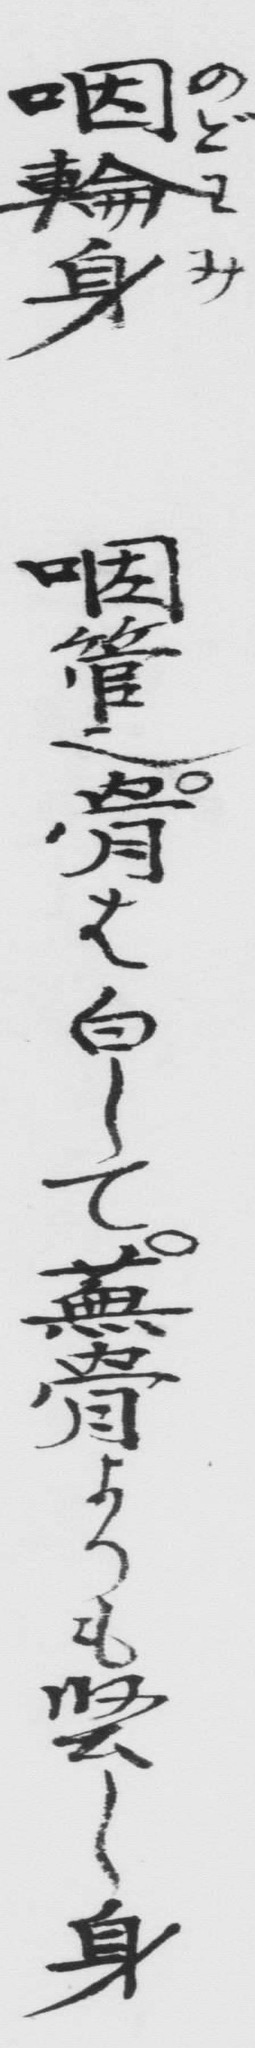咽輪身咽管也。骨は白して。蕪骨よりも堅し身
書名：鯨肉調味方
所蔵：大阪府立大学学術情報センター 国文学研究資料館
